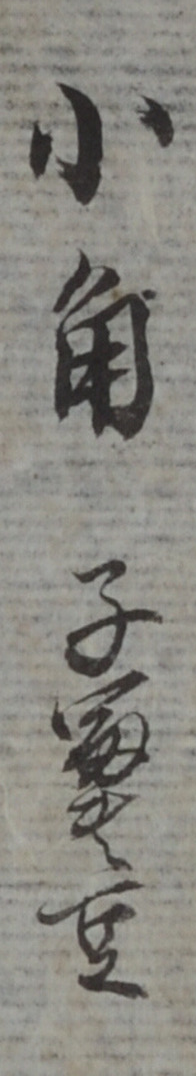小角子冨貴豆
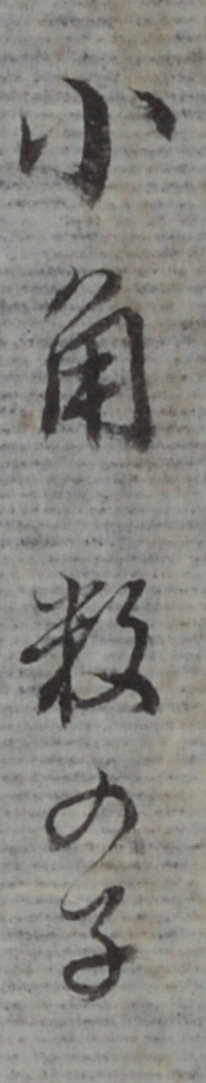小角数の子
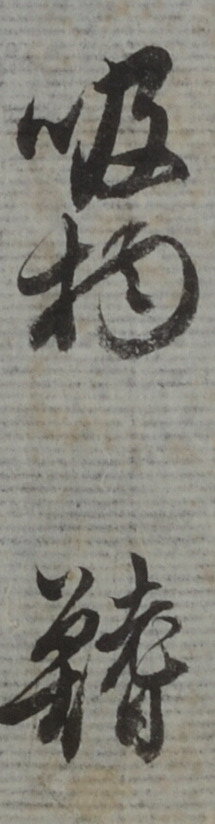吸物鰭
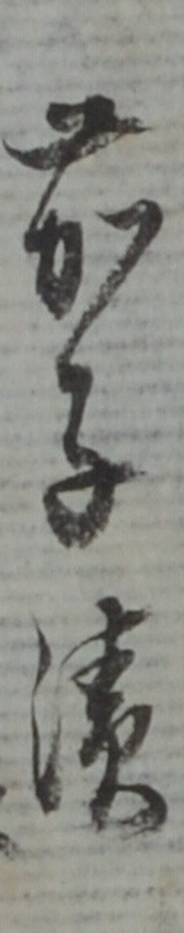茄子漬
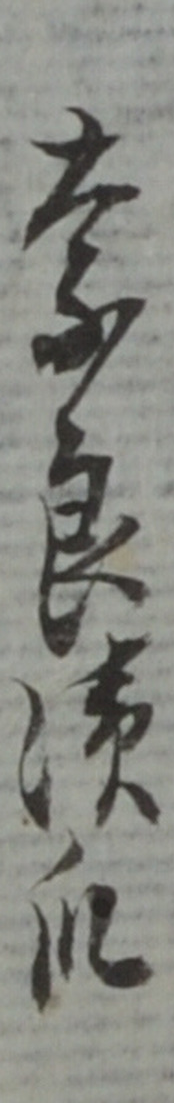奈良漬瓜
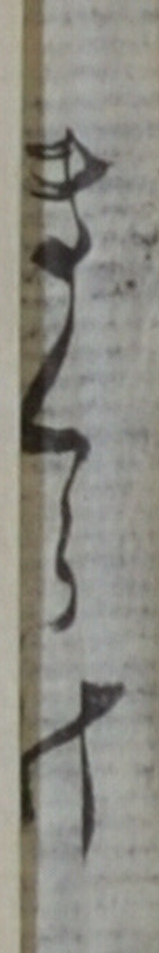きくらけ

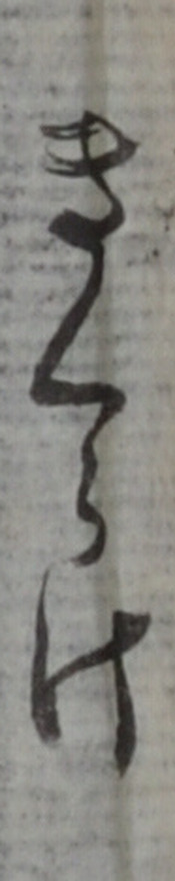きくらけ
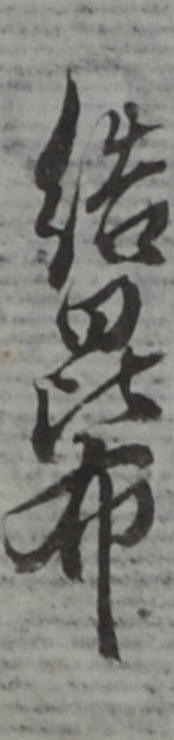結昆布
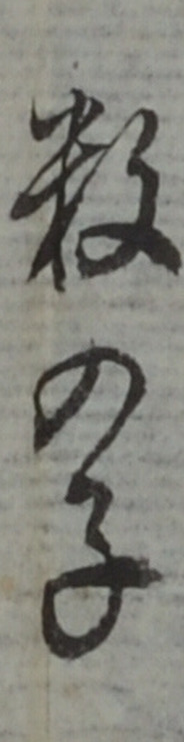数の子
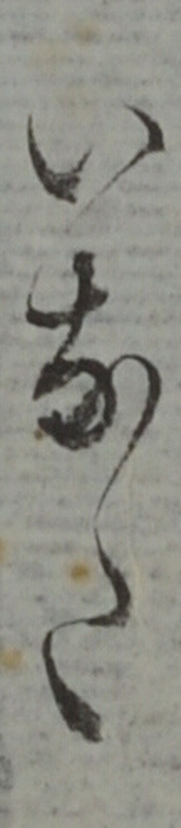いなた
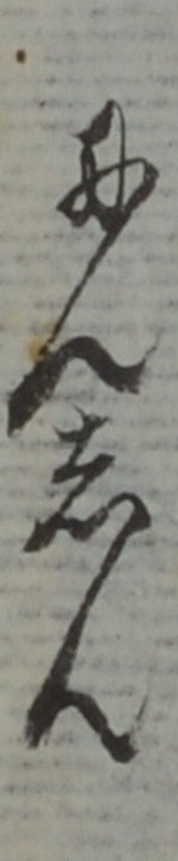にんしん
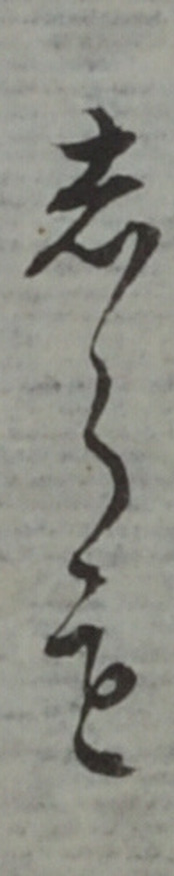しらも
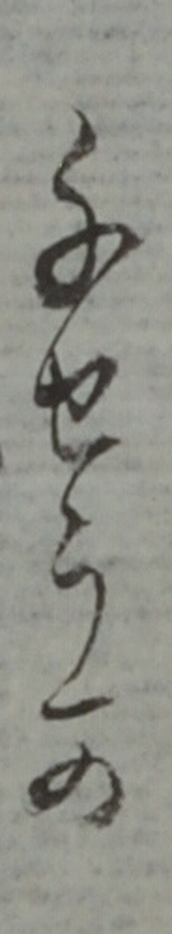千せうか
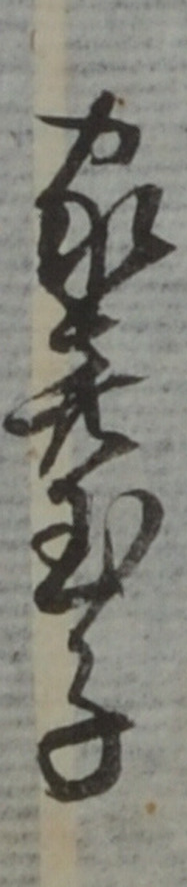家喜玉子
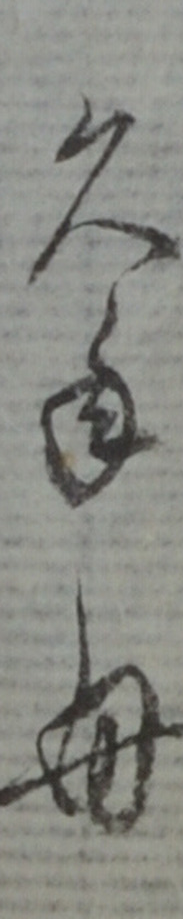久年母
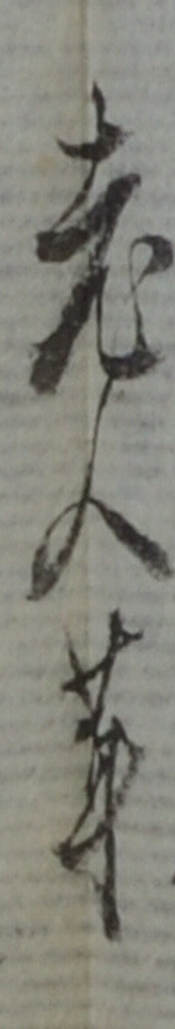老人茸
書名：献立書上
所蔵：伊那市立高遠町図書館・合同会社AMANE
